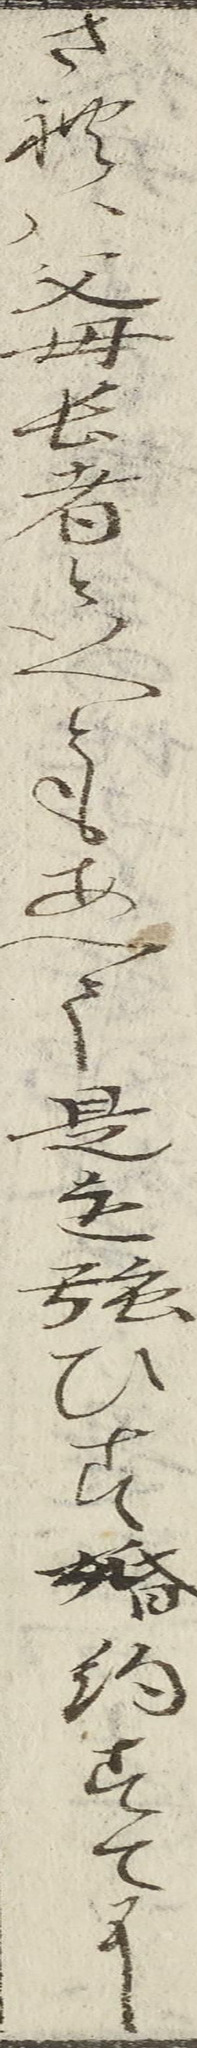されハ父母長者といへともあへて彼を強ひす婚約すてに
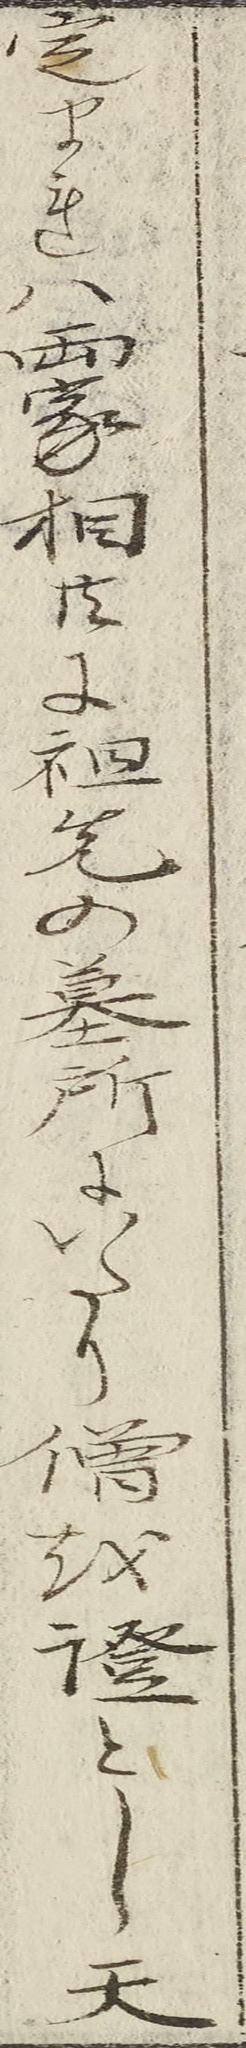定まれハ兩家相共に祖先の墓所にいたり僧を證とし天
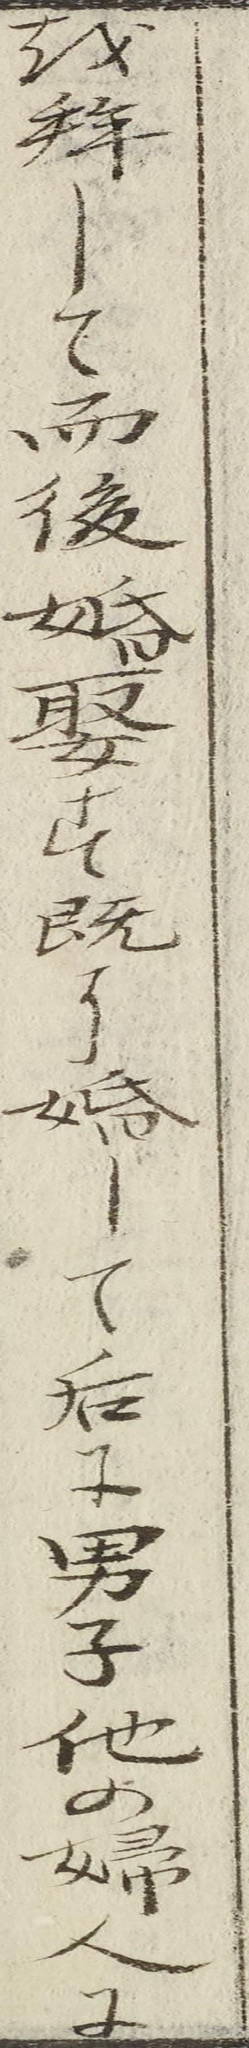を拝して而後婚娶す既に婚して後に男子他の婦人に
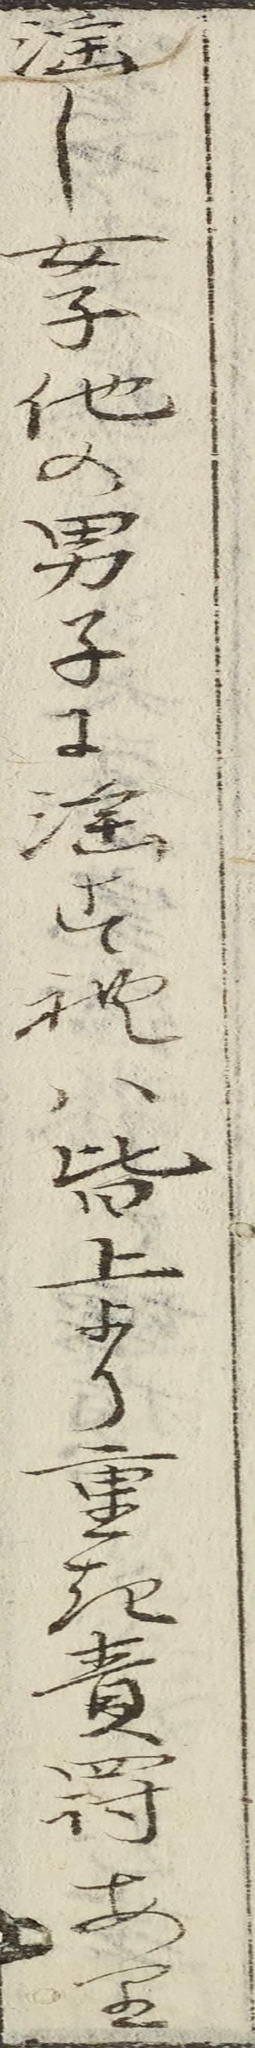淫し女子他の男子に淫すれハ皆上より重き責罰あり
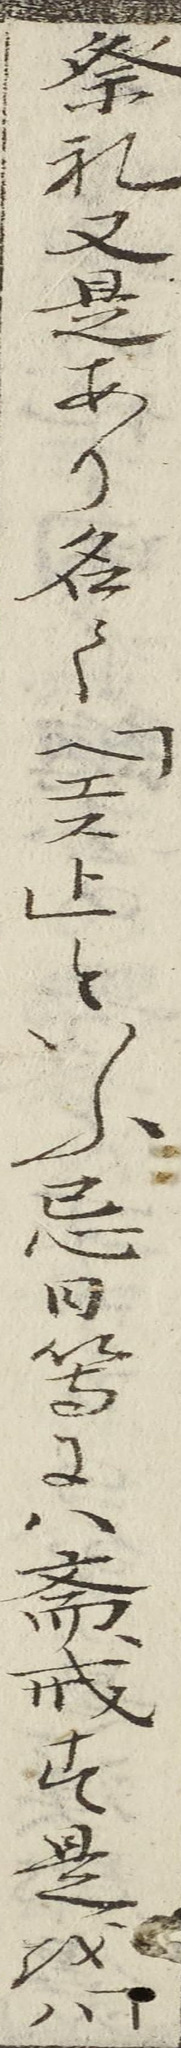祭礼又是あり名て「ㇸエㇲト」といふ忌日等にハ斎戒す是を「ハ
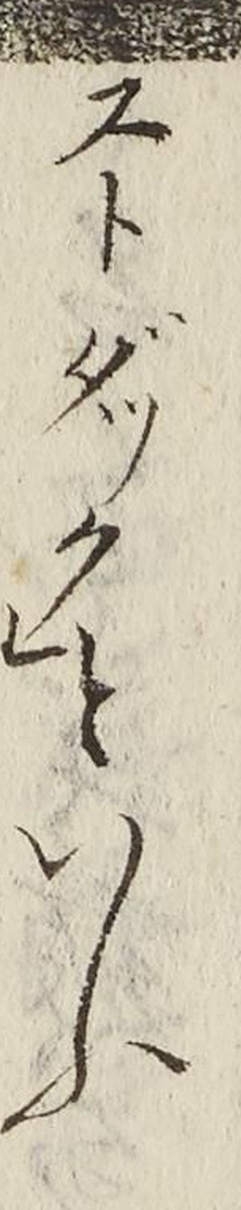ストダック」といふ
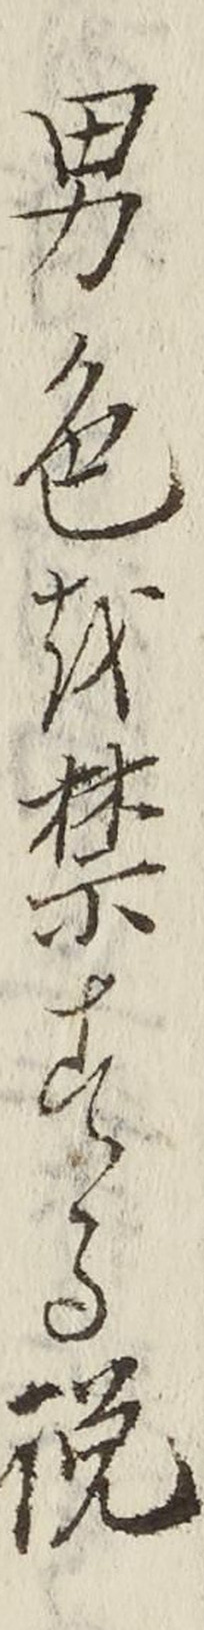男色を禁する説
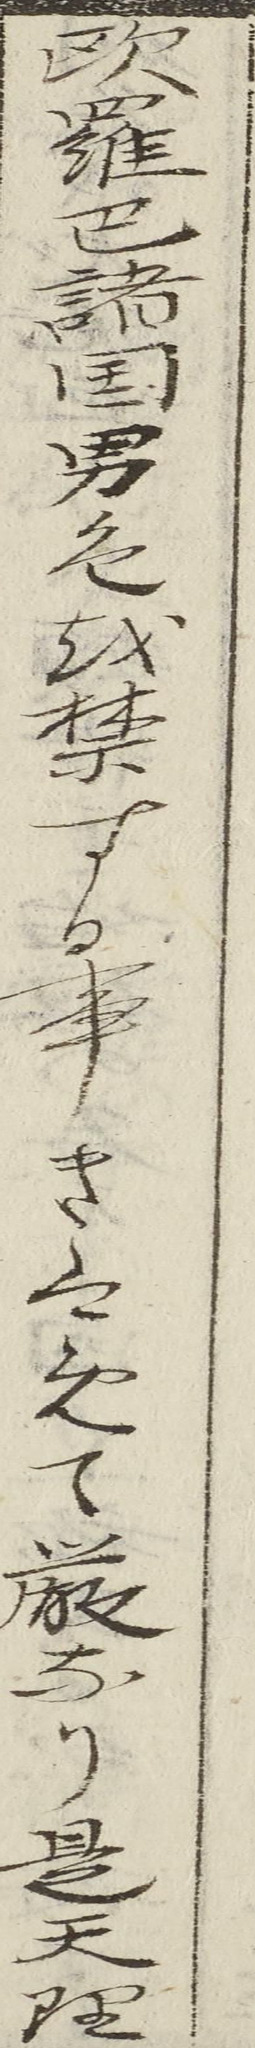欧羅巴諸国男色を禁する事きわめて厳なり是天理
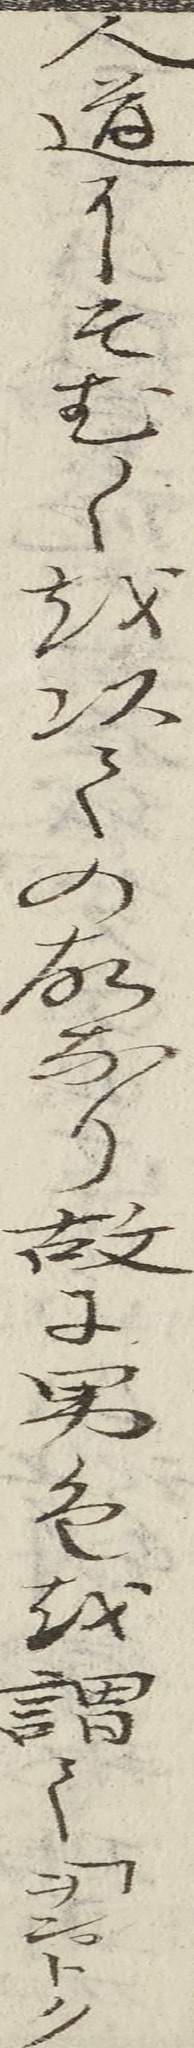人道にそむくをも以ての故なり故に男色を謂て「ヲン。トク
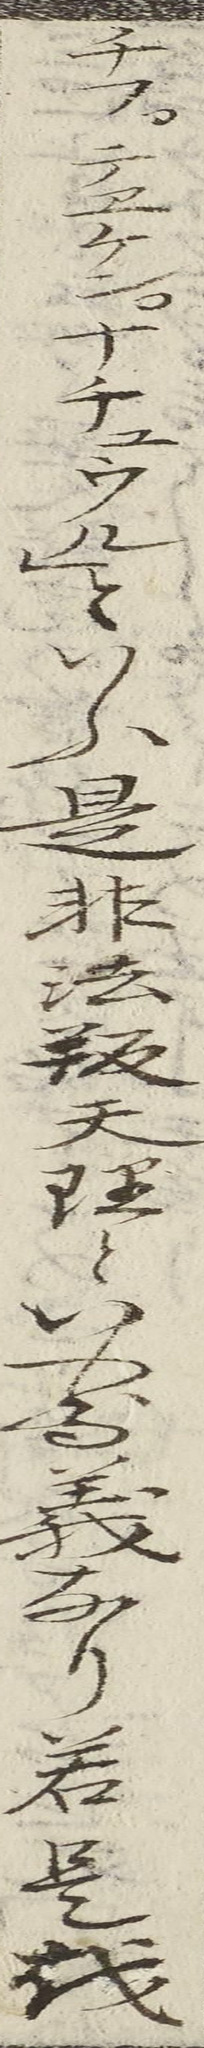チフ。テヱケン。ナチュル」といふ是非法叛天理といつて義なり若是を
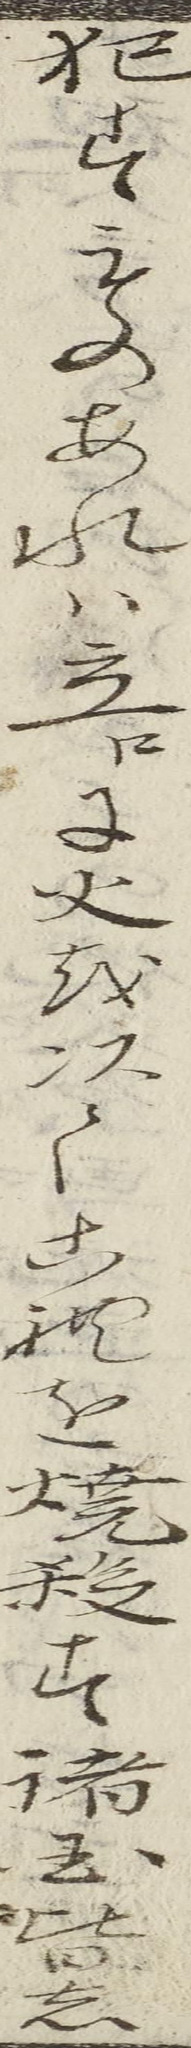犯すものあれハ立に火を以てこれを焼殺す諸国皆し
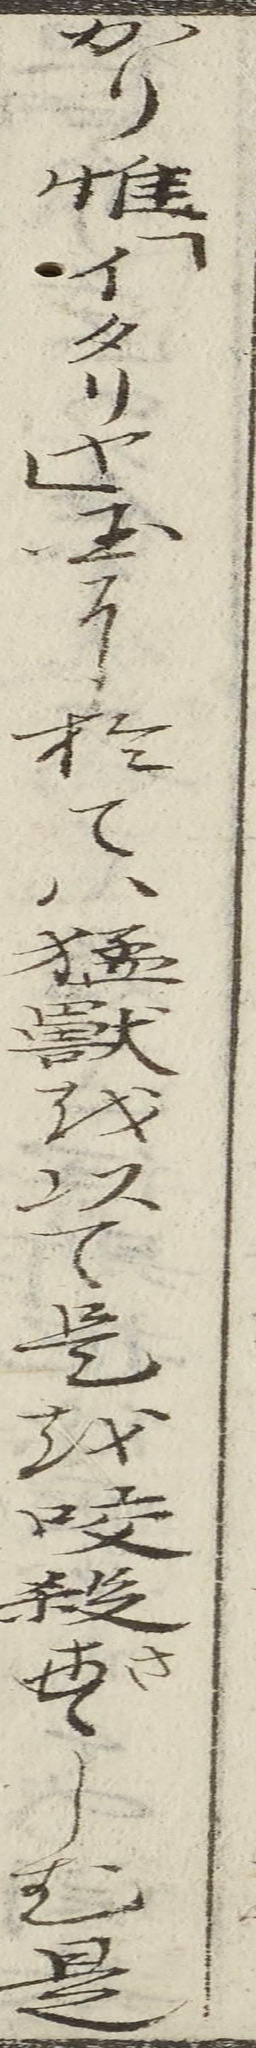かり唯「イタリヤ」国に於てハ猛獣を以てこれを咬殺さしむ是
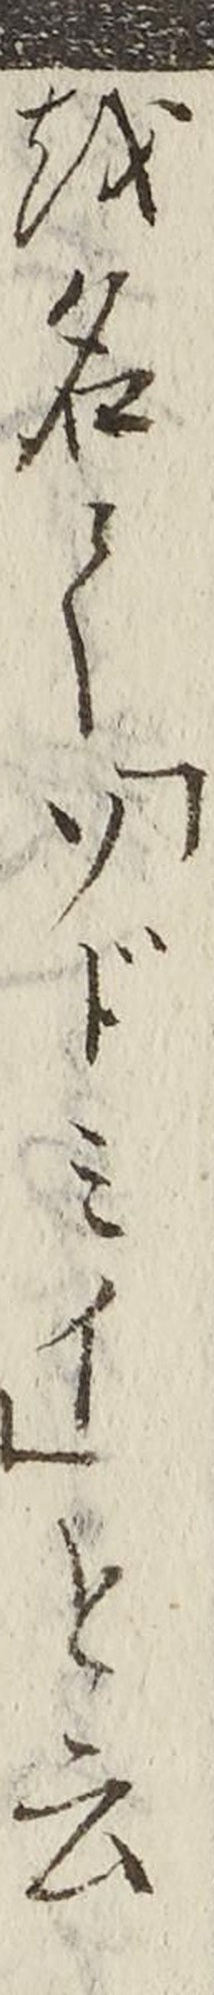を名て「ソドミイ」と云
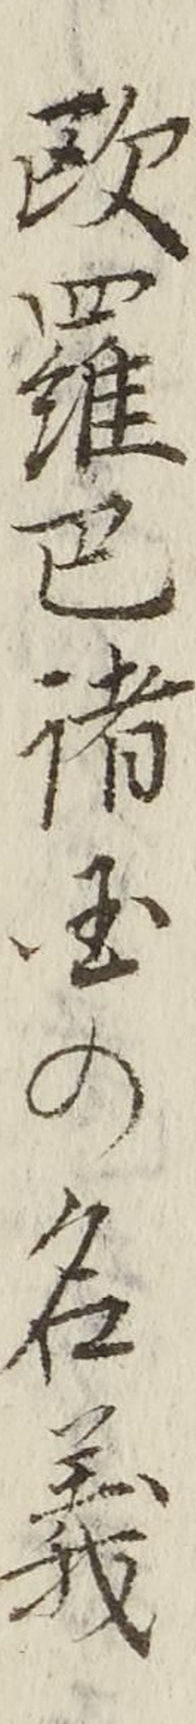欧羅巴諸国の名義
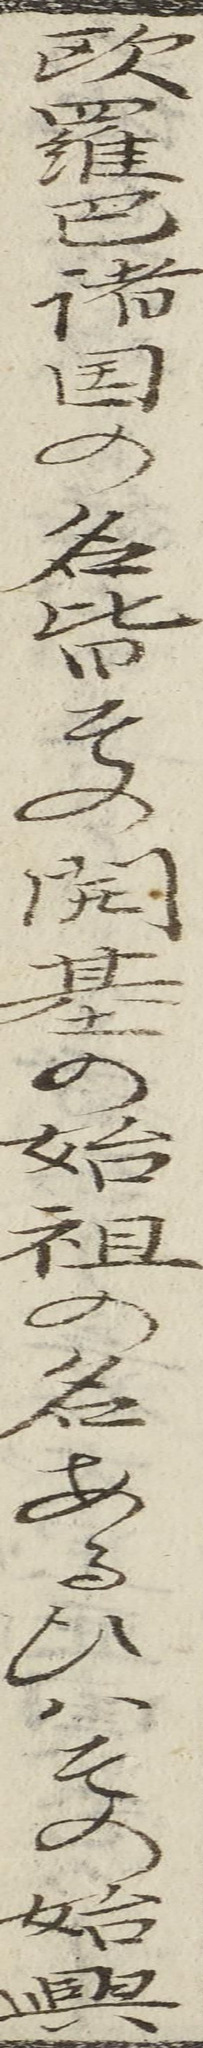欧羅巴諸国の名皆その開基の始祖の名あるひハその始興

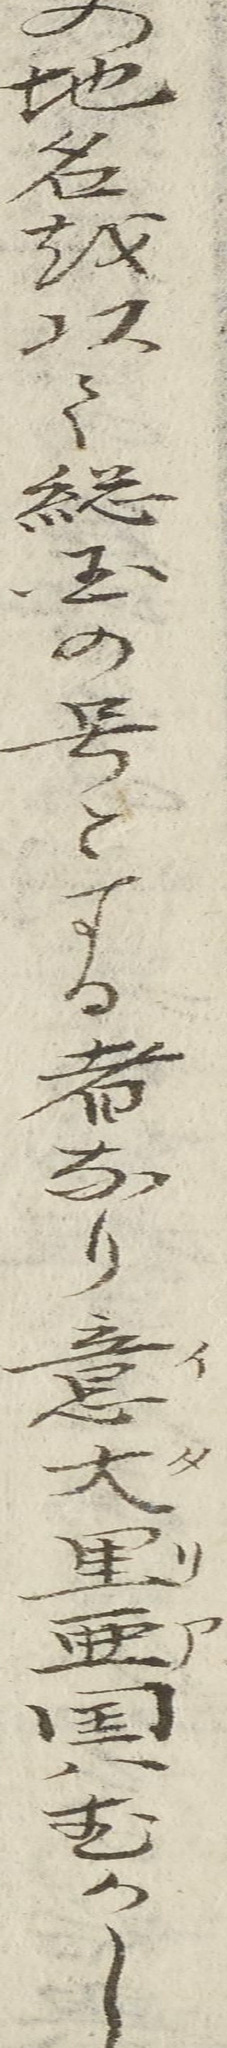の地名を以て総国の号とする者なり意大里国はむしろ
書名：西洋雜記　坤
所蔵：東京大学地震研究所図書室 Earthquake Research Institute Library, The University of Tokyo, JAPAN
